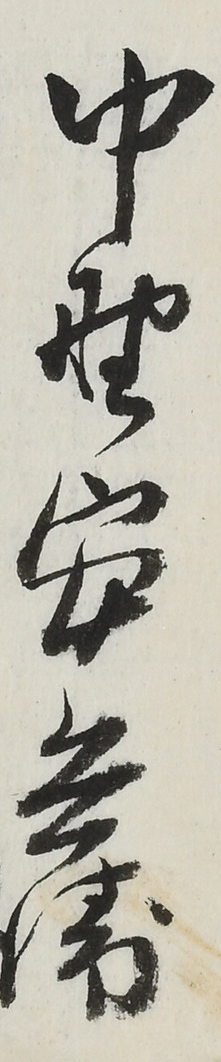中野安兵衛
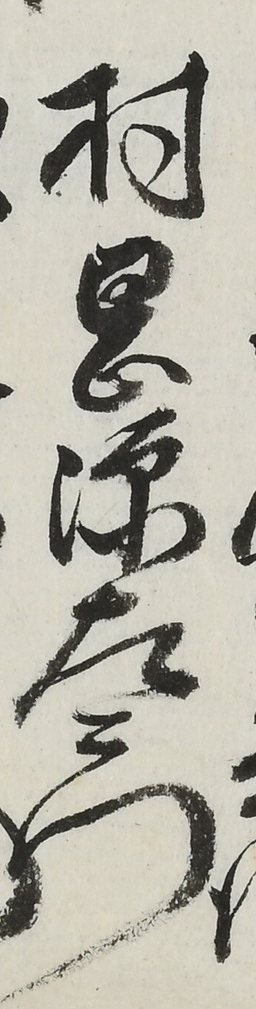村岡源左衛門
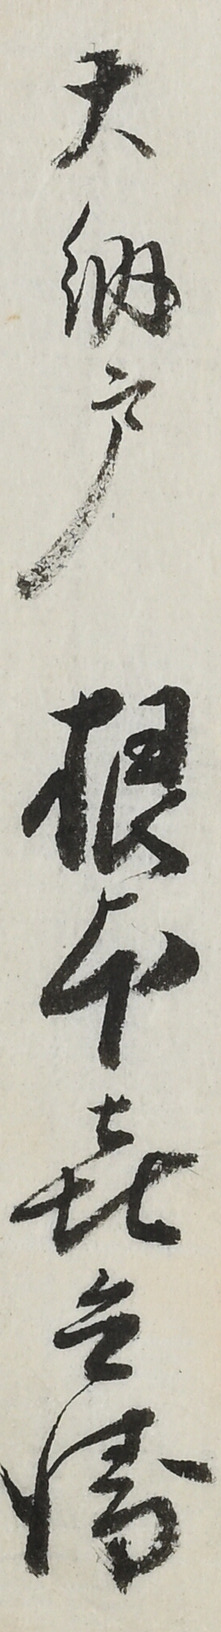大納戸根本喜兵衛

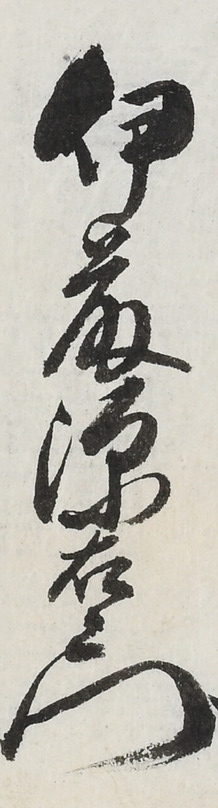伊藤源右衛門
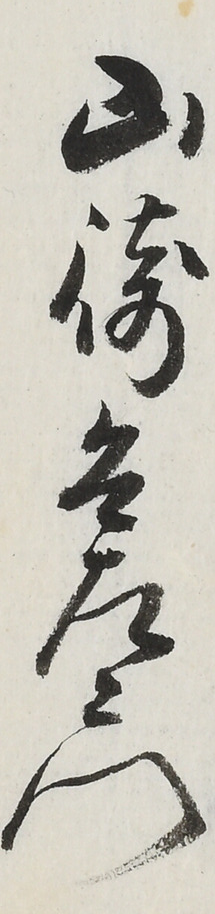山崎兵左衛門
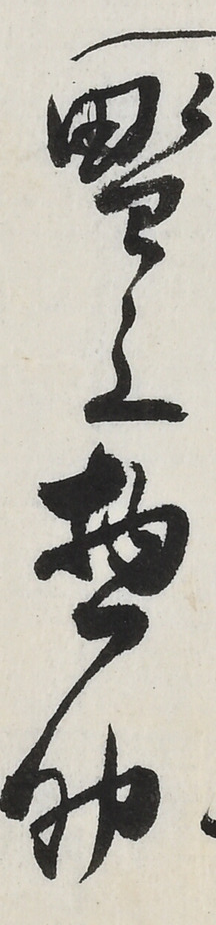野上惣助
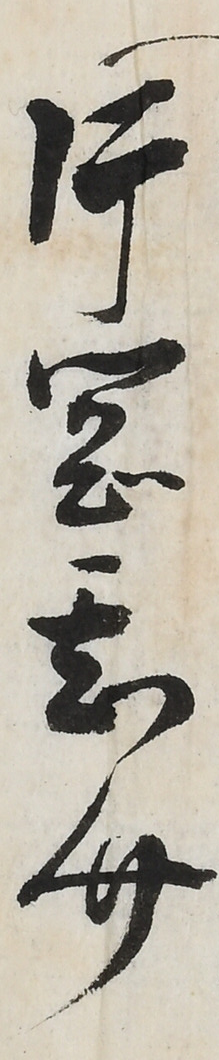片岡勘介
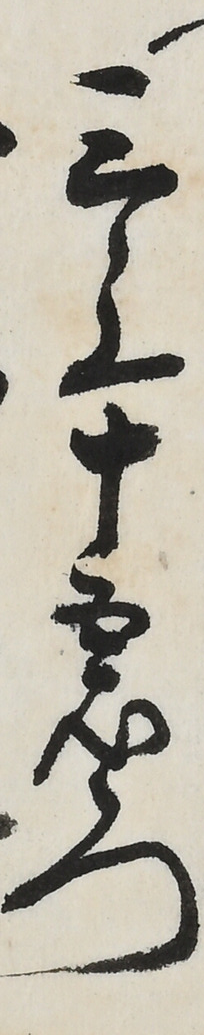三上十五右衛門
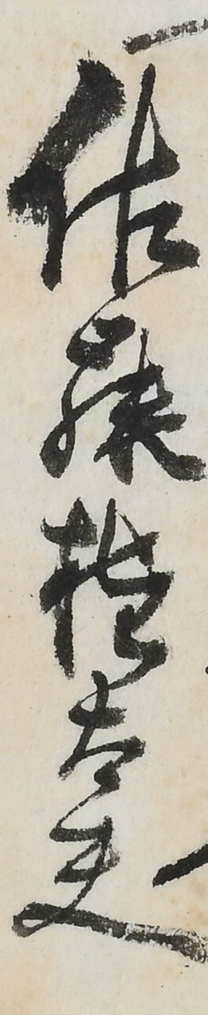佐藤権太夫
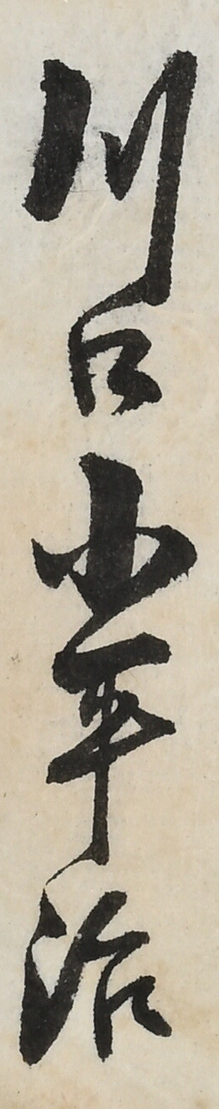川口小平治
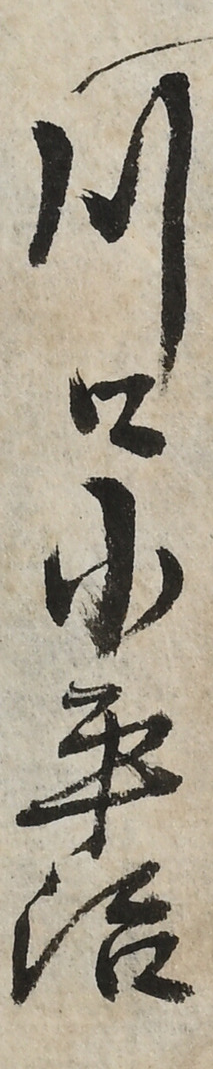川口小平治
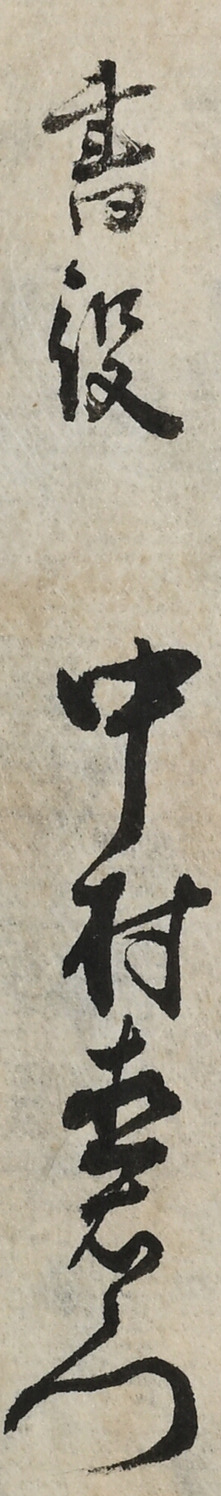馬役中野武右衛門

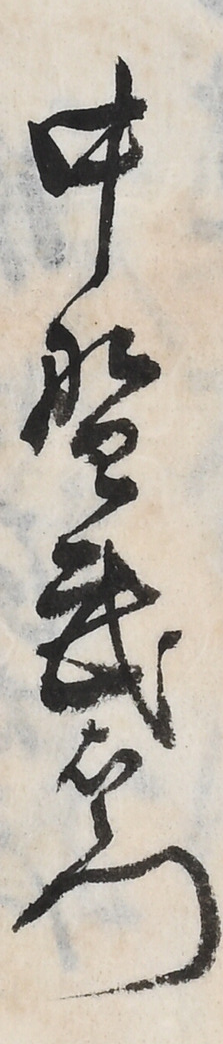中根覚右衛門
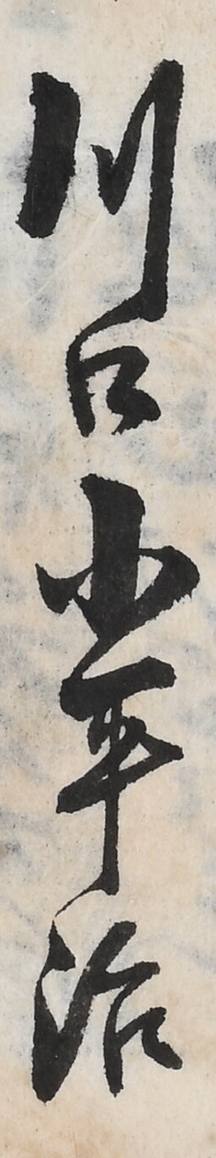川口小平治
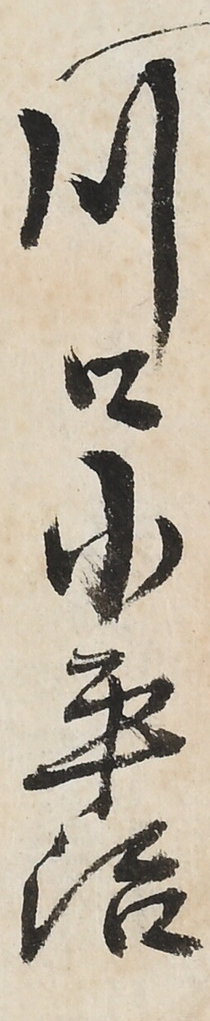川口小平治
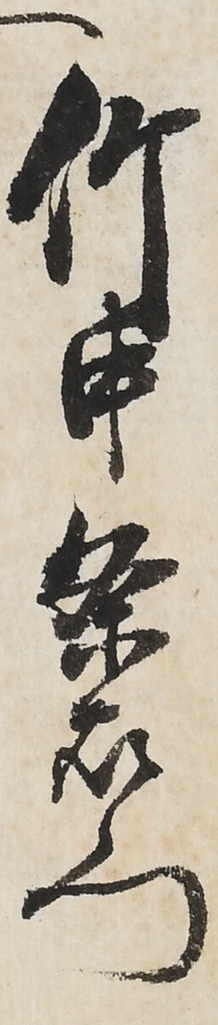竹中粂右衛門
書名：高遠江戸徒以上之面々
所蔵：伊那市立高遠町図書館・合同会社AMANE
